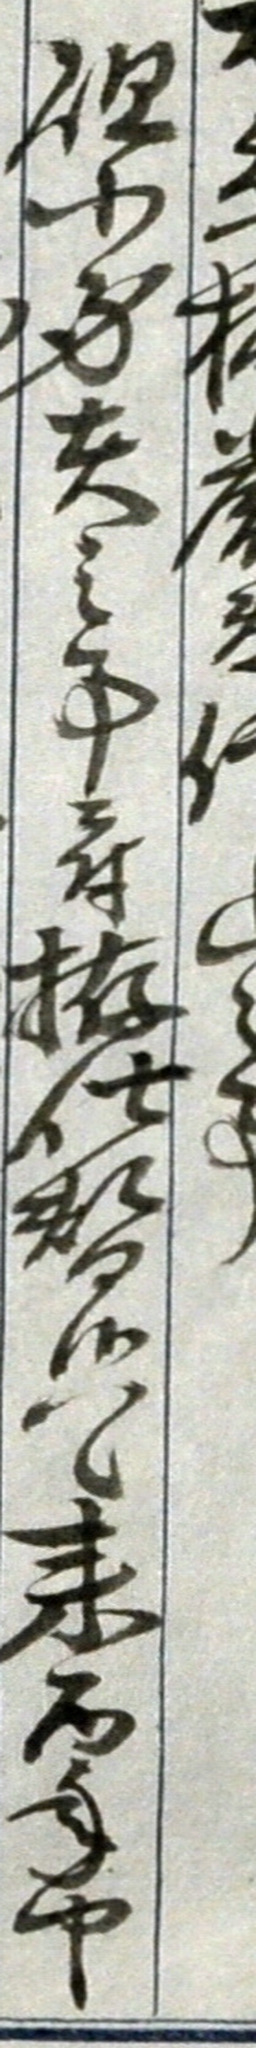但小身者之事ニ付拵仕替候ハヽ来酉年中
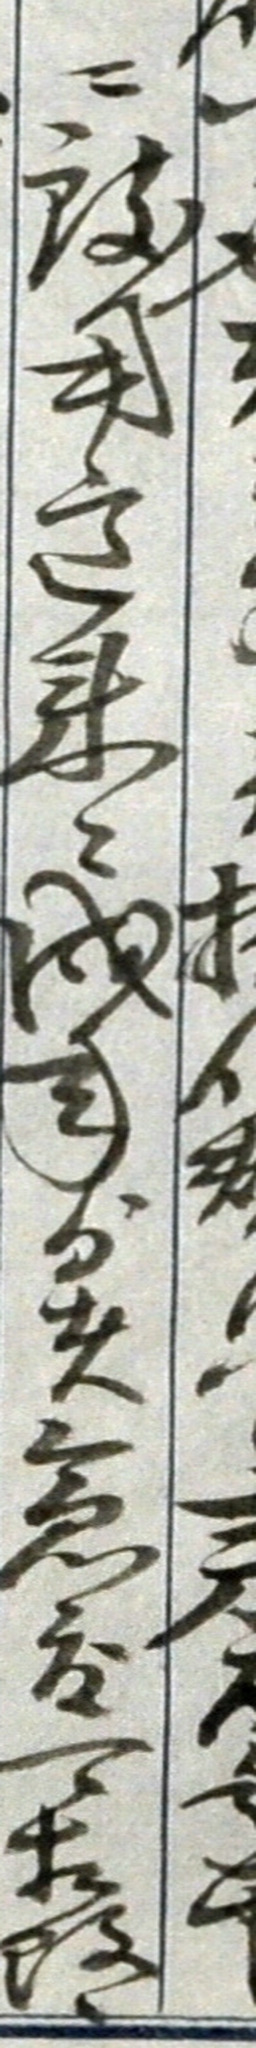ニ致用意来々戌年ゟは急度可相改候
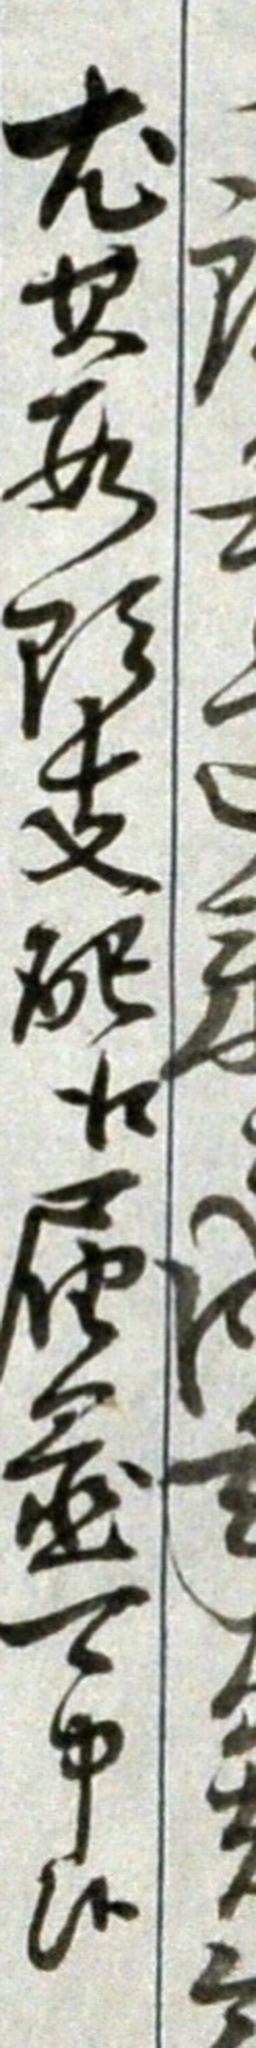尤其段頭支配え届置可申候
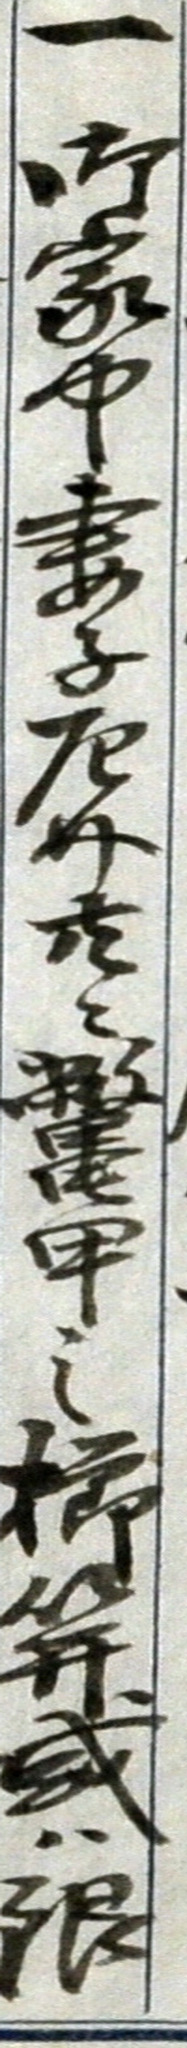一御家中妻子厄介共ニ鼈甲之櫛笄或ハ銀
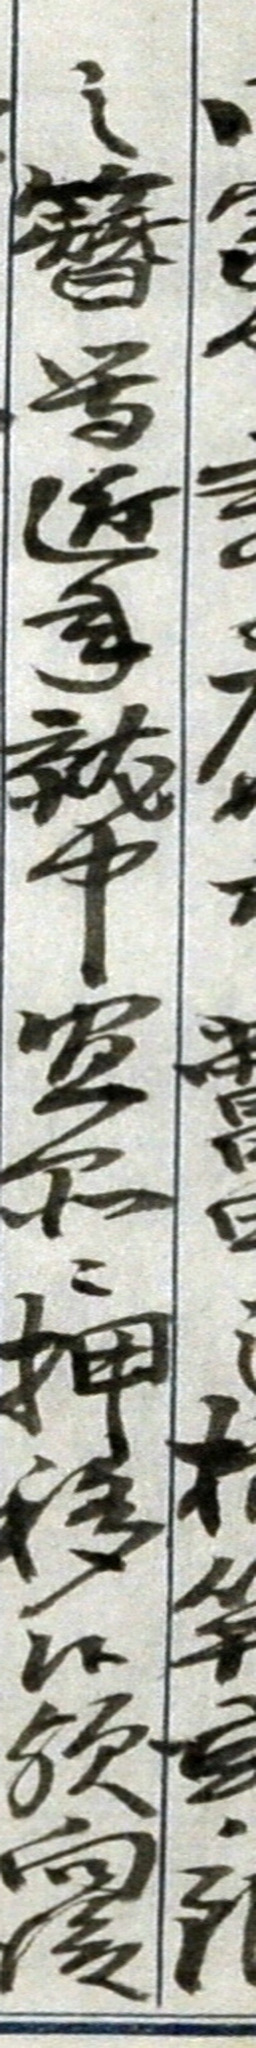之簪等近年就中宜品ニ押移候欤向後
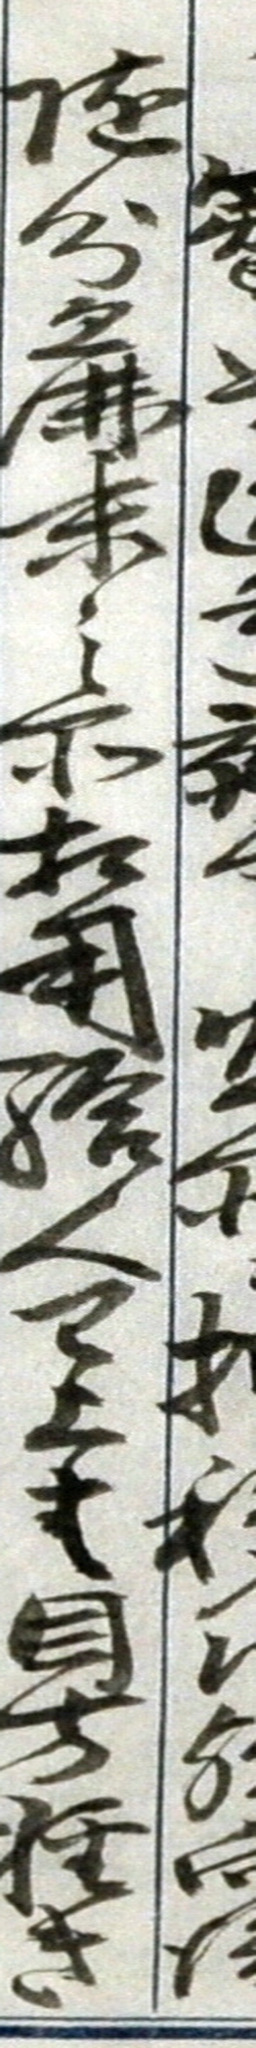随分麁末之品相用給人已上は目方軽き
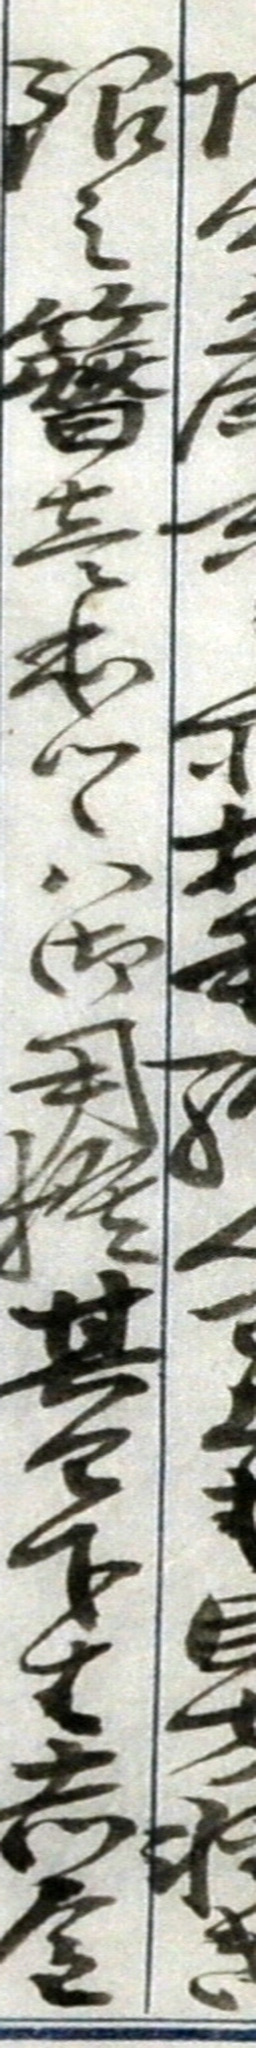銀之簪壱本ツヽハ御用捨其已下は赤金
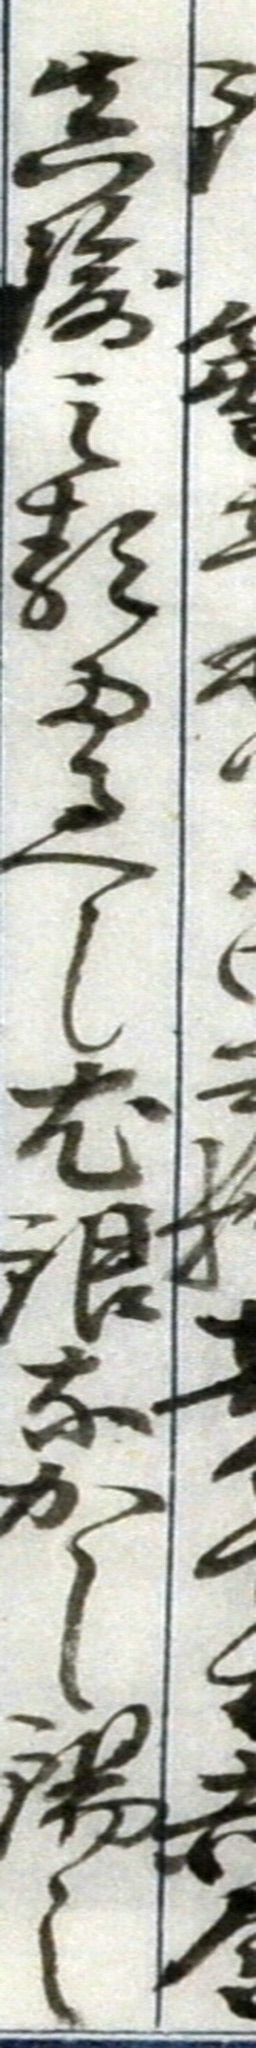真鍮之類たるへし尤銀なかし錫之
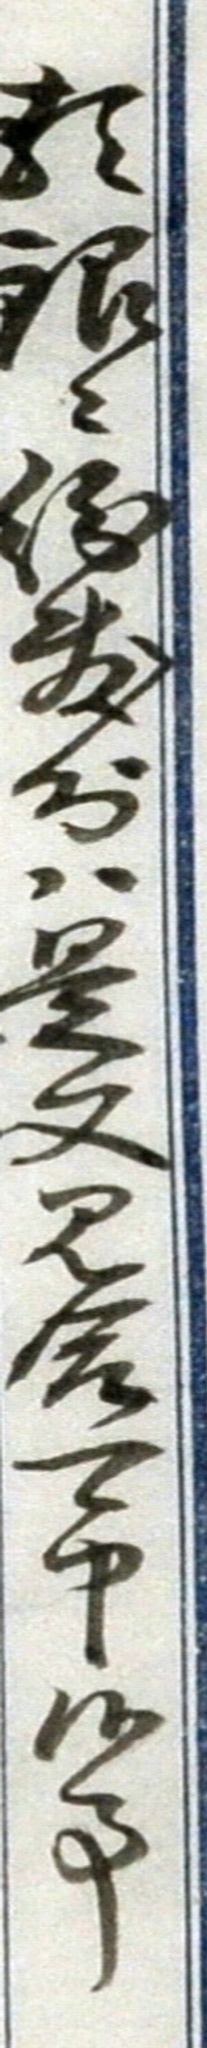類銀ニ紛敷分ハ是又見合可申候事
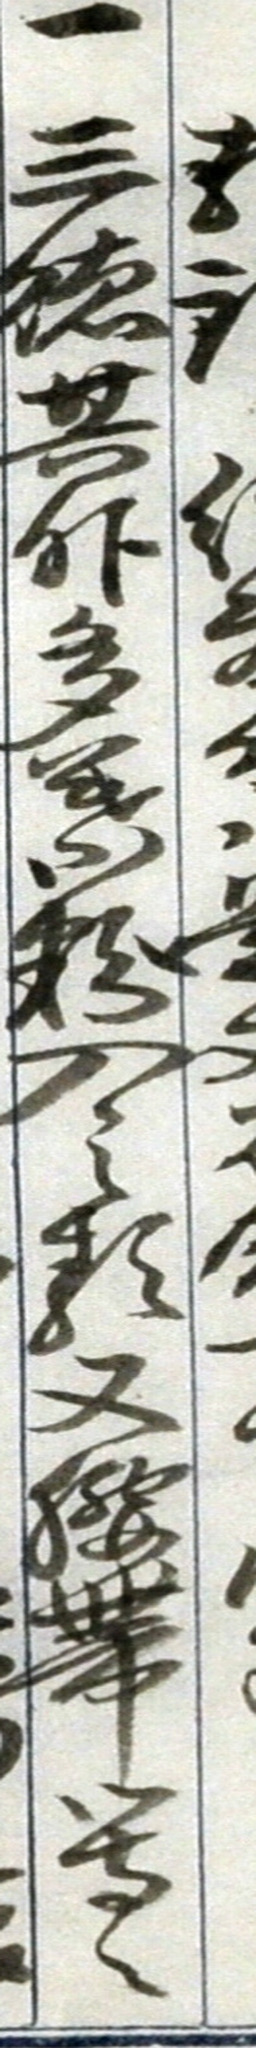一三徳其外多葉粉入之類又腰帯等ニ
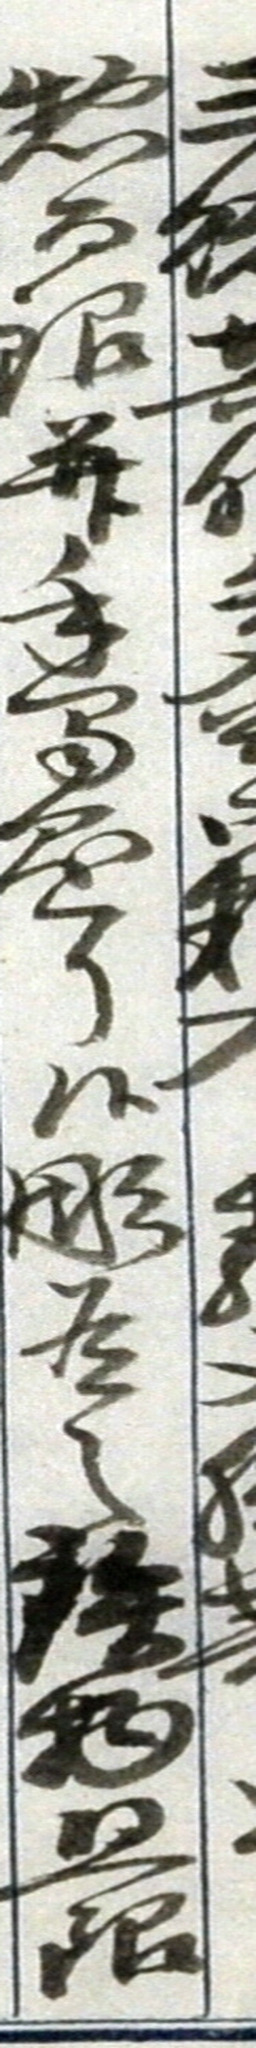惣而銀并手間懸り候彫有之鉄物且銀
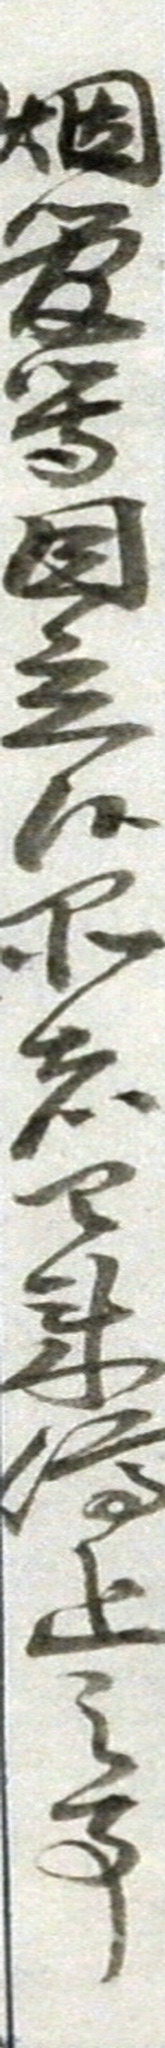煙管等目立候品は已来停止之事
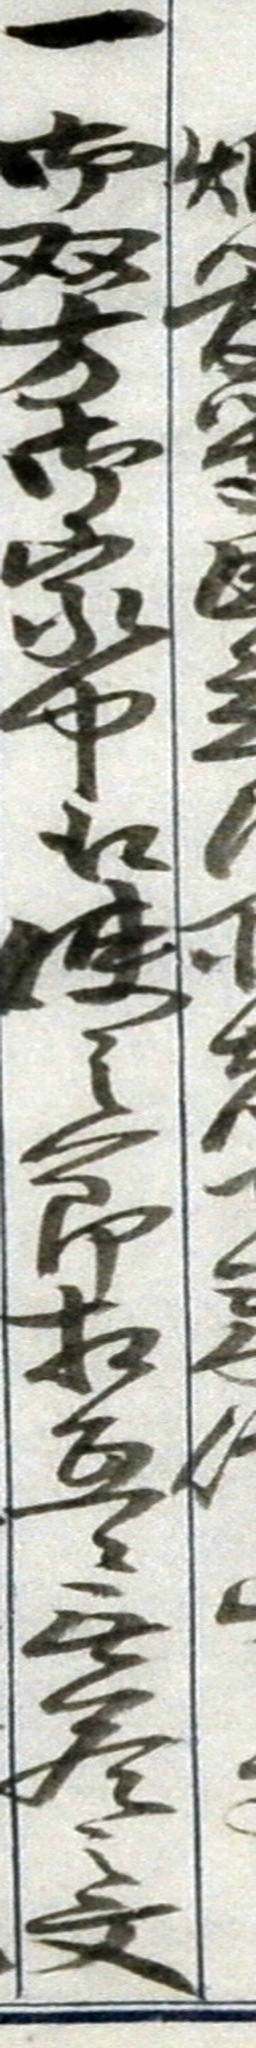一御双方御家中江使之節相互ニ無尽之文
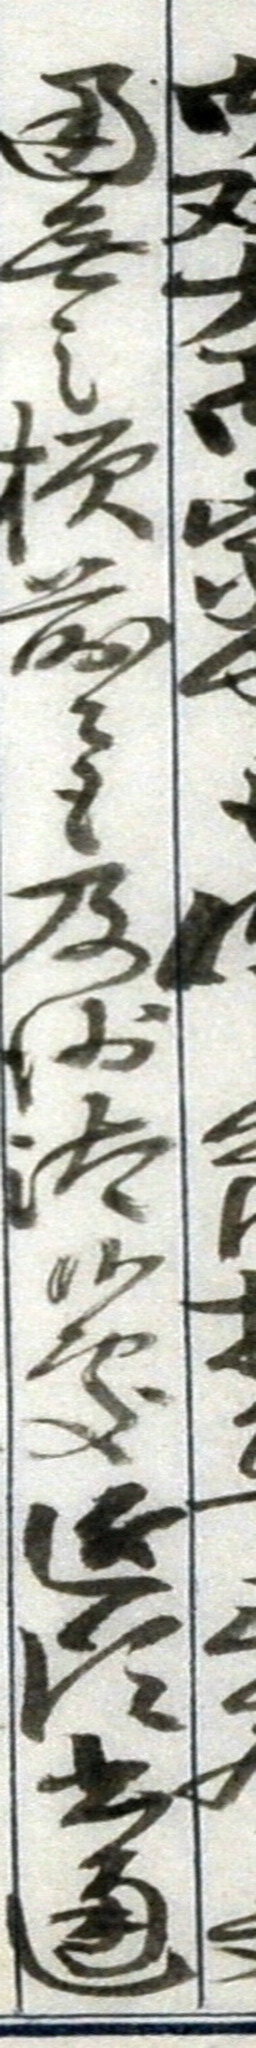通無之様前ニも及沙汰候処近頃書通
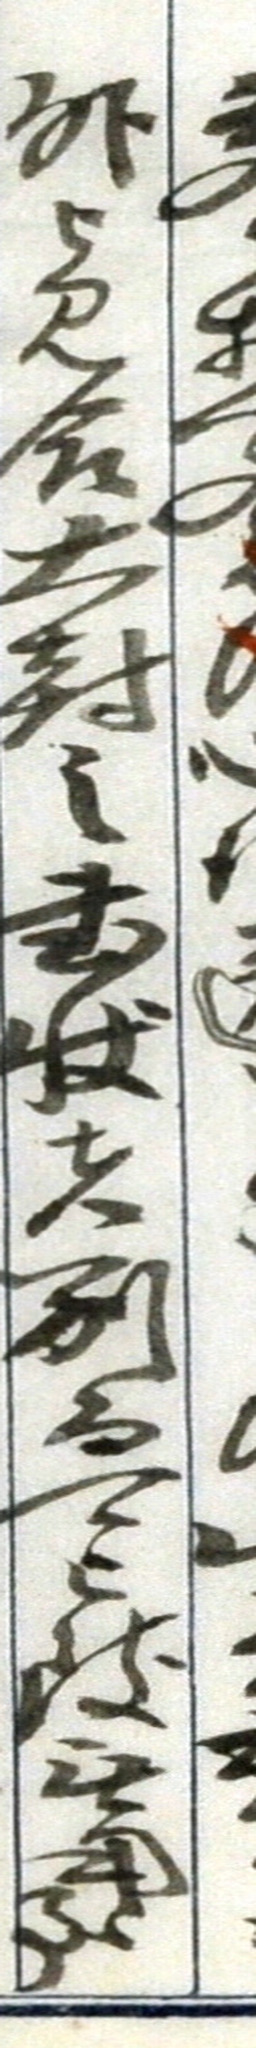外被見合大封之書状は別而可被致無用候事
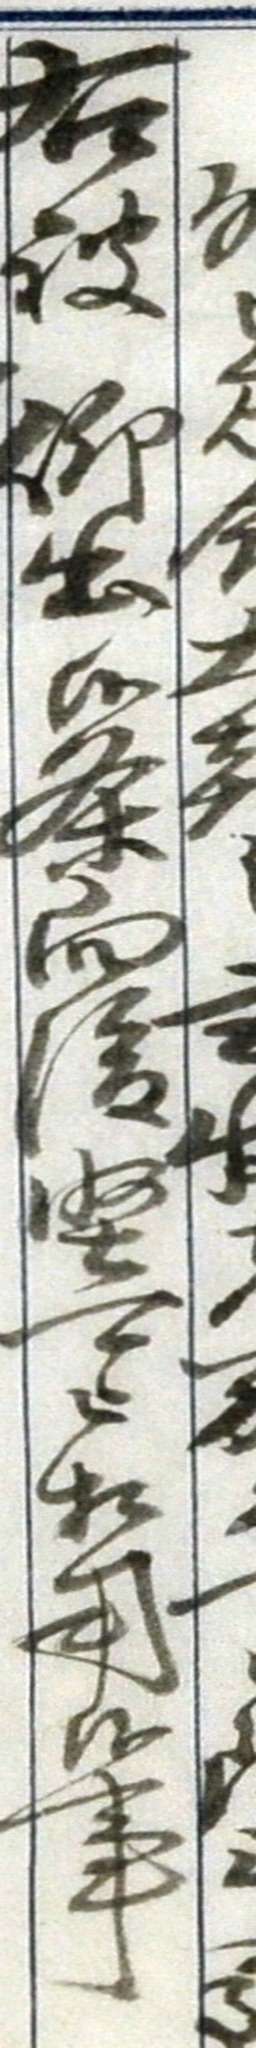右被仰出候条向後堅可被相用候事
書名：御倹約被仰出書
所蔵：伊那市立高遠町図書館・合同会社AMANE
